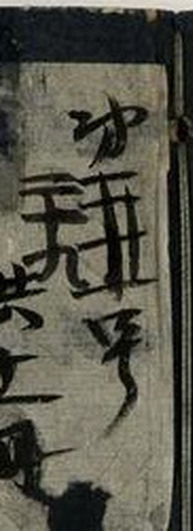第二十一号
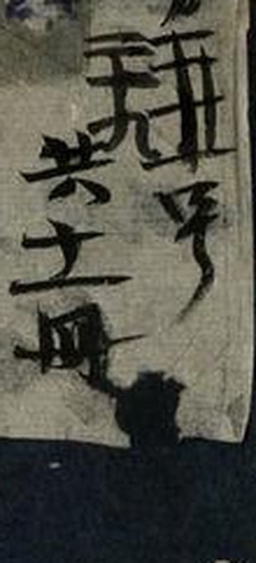共十一冊
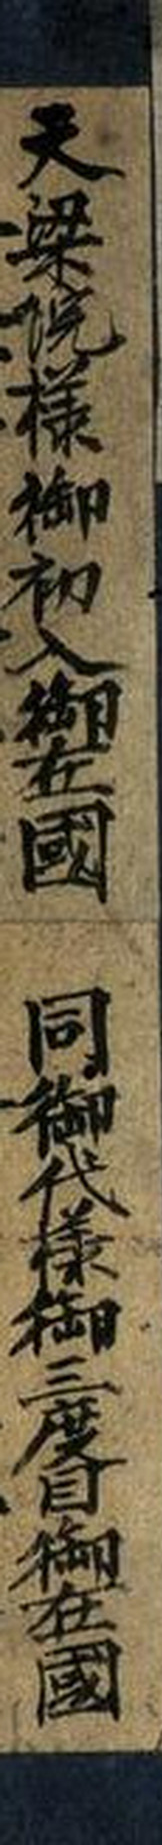天梁院様御初入御在國同御代様御三度目御在國
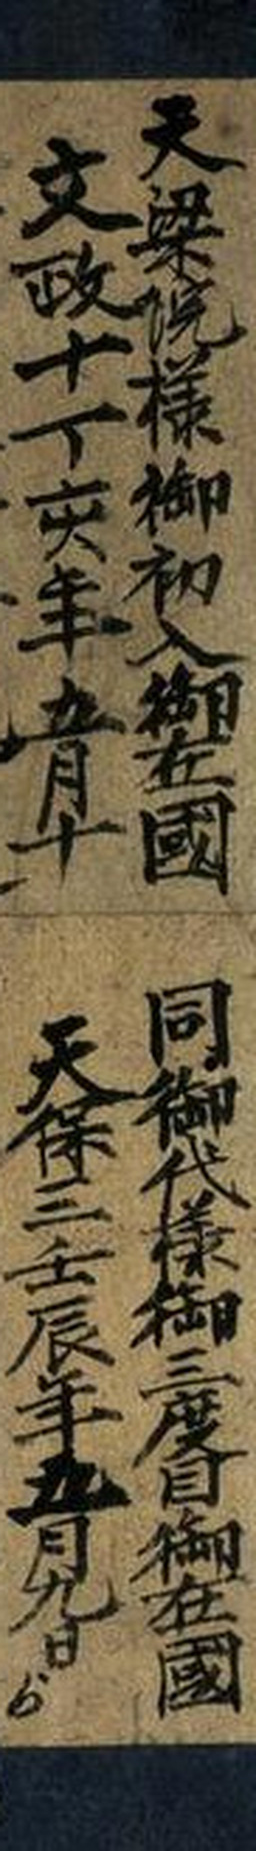文政十丁亥年五月十天保三壬辰年五月九日ゟ
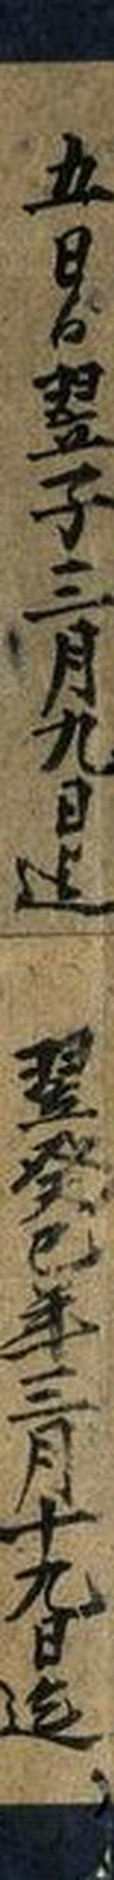五日ゟ翌子三月九日迄翌癸巳年三月十九日迄
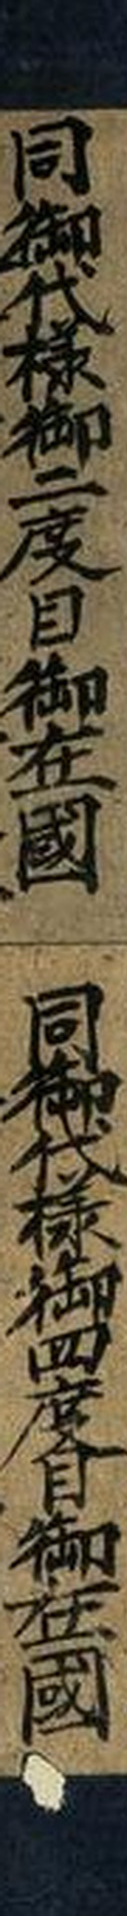同御代様御二度目御在國同御代様御四度目御在國
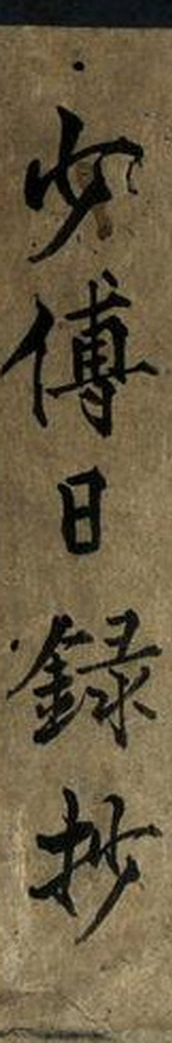少傳日録抄

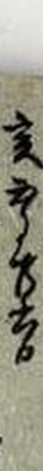亥五月廿六日
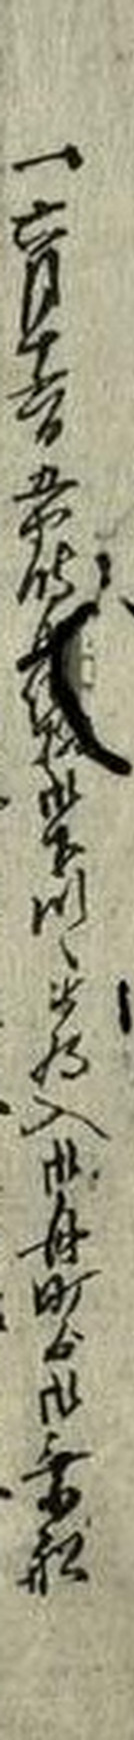一六月十六日五半時御供揃御下川へ被為入御舟町ゟ御乗舩
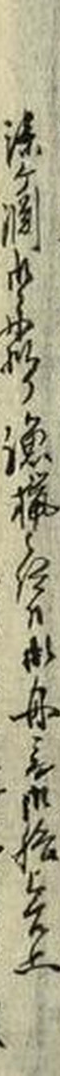漆ヶ凋御舟掛り漁猟被仰付御舟ニ而御膳被召上
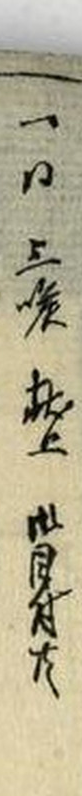一同三喉献上御目付共
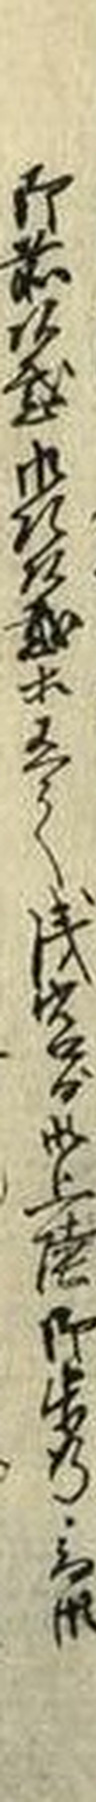御前頂戴御次頂戴等有之浅宮ゟ御上陸御歩行ニ而御
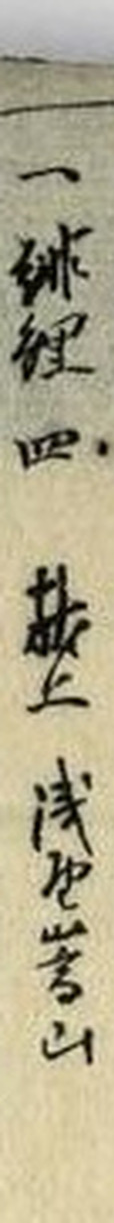一緋鯉四献上浅野嵩山
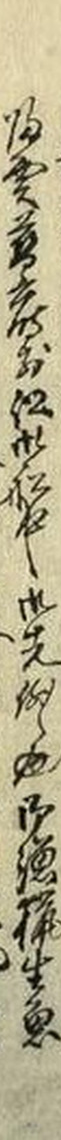帰殿暮六時前但組御船中御先例之通御漁猟生魚
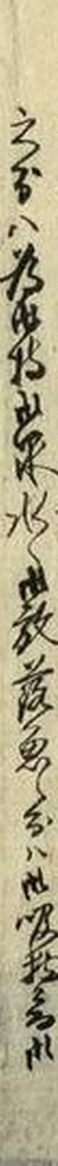之分ハ為御持御泉水へ御放落魚之分ハ御吸物ニ而御
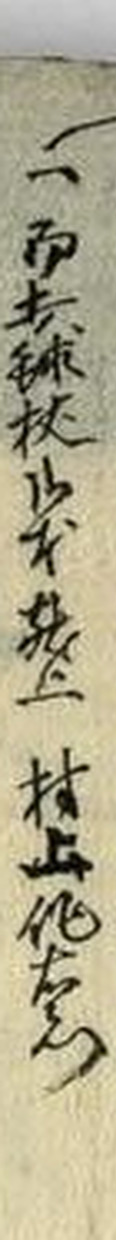一百打毬杖弐本献上村上作右衛門
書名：少傅日録抄（斉承付側向頭取日記、在国）
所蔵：福井県文書館 Fukui Prefectural Archives
